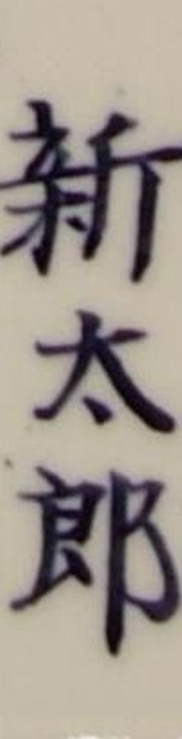新太郎
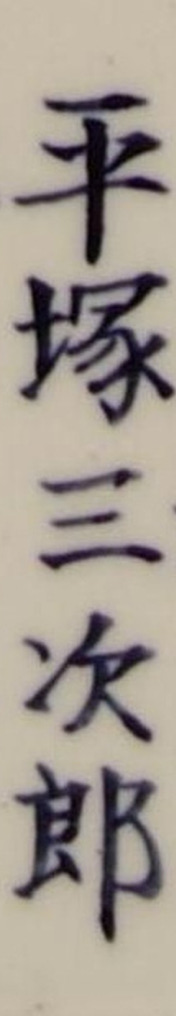平塚三次郎
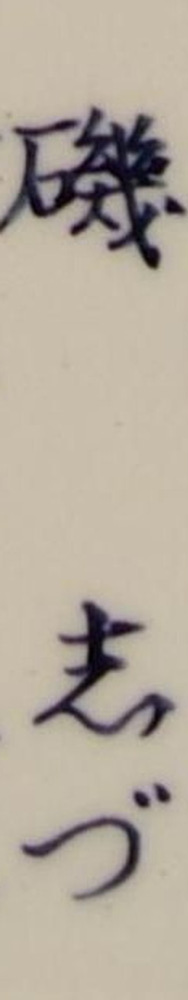磯しづ
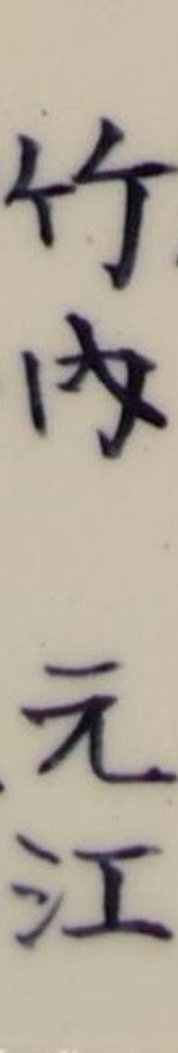竹内元江
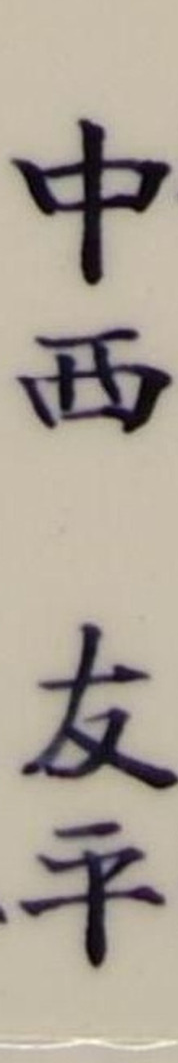中西友平
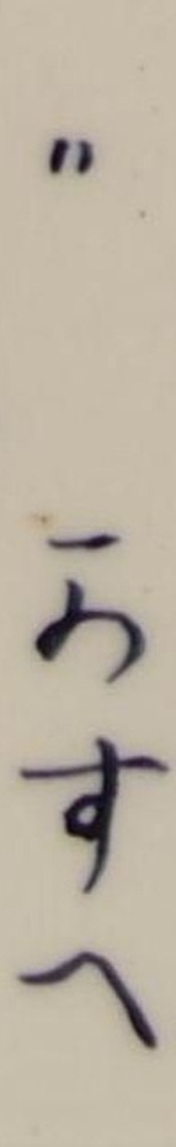かすへ
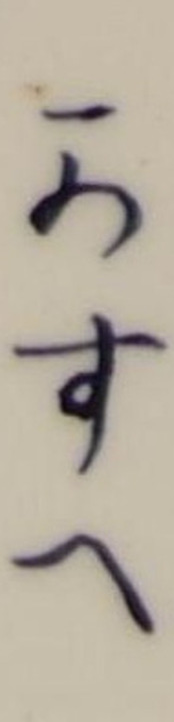かすへ
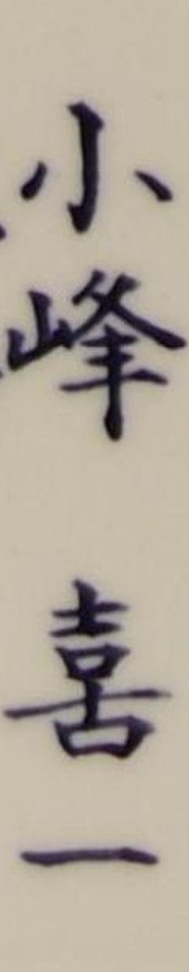小峰喜一
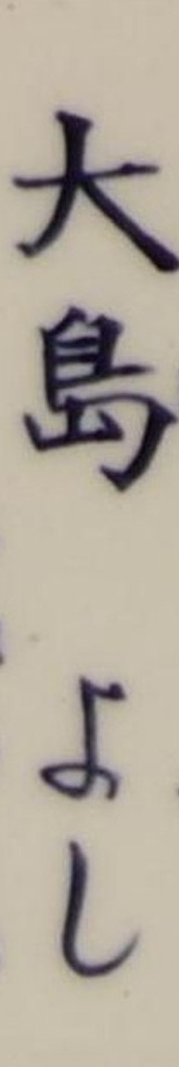大島よし
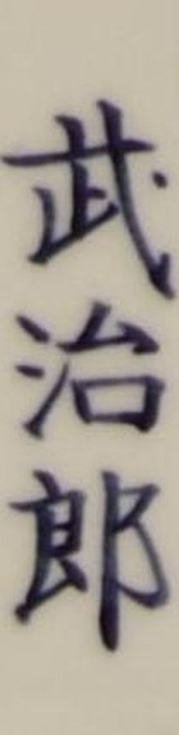武治郎
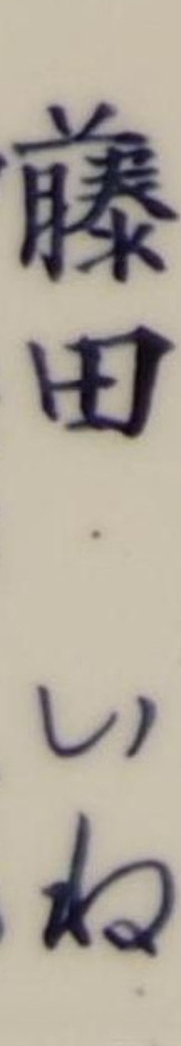藤田いね
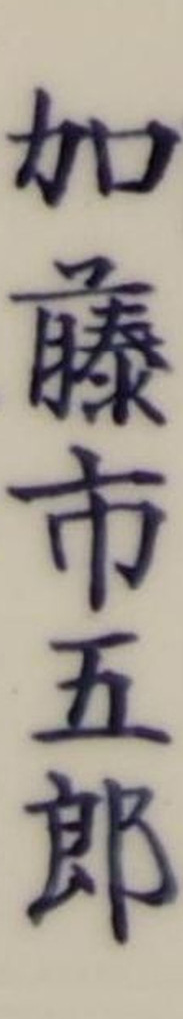加藤市五郎
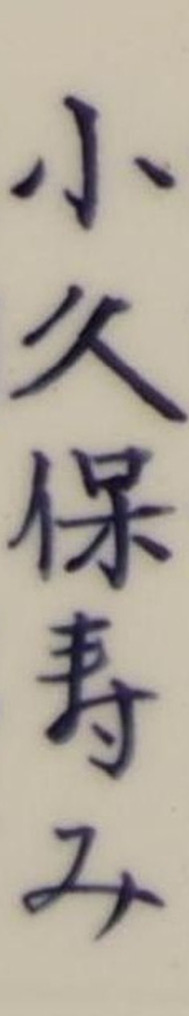小久保すみ
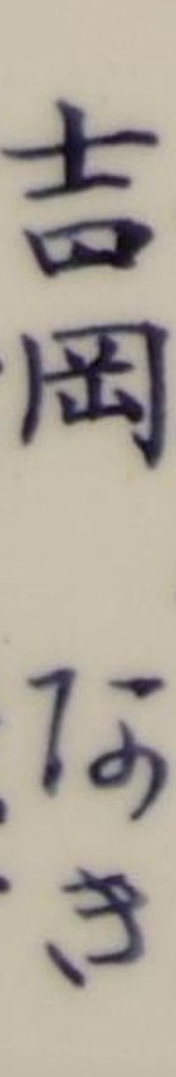吉岡あき
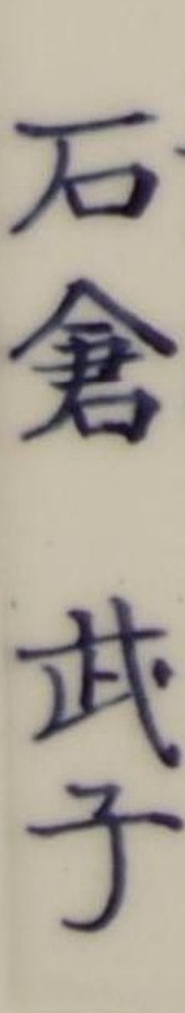石倉武子

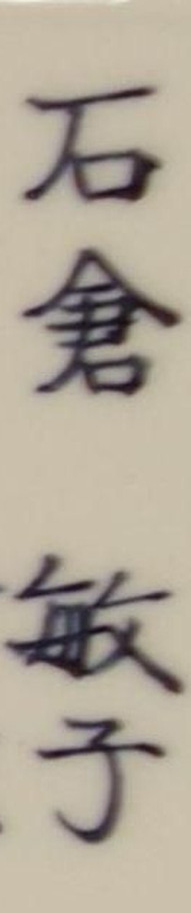石倉敏子
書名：E~L
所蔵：高野山金剛峯寺
